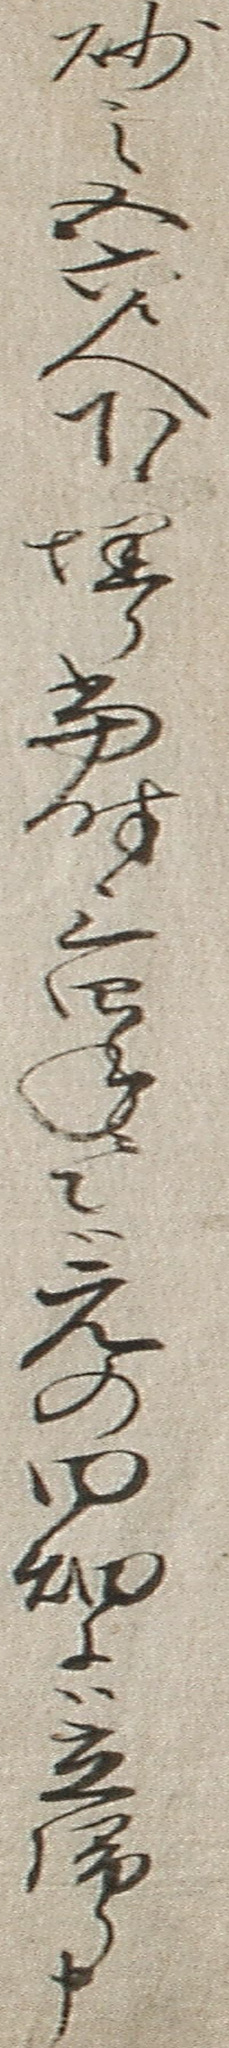砂之五六尺下ニ埋り当時三四年にては元の田畑には立帰り申
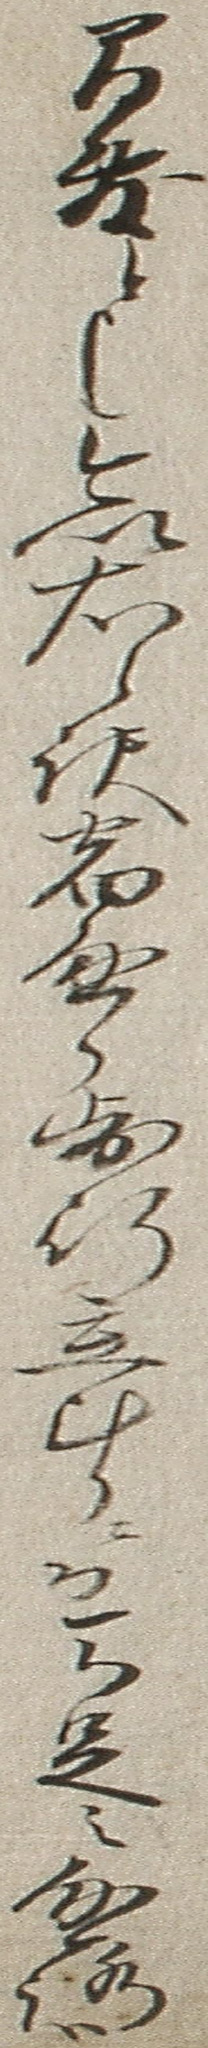間敷と申候今以右之駅宿通り歩行立斗りに而馬足之通路は

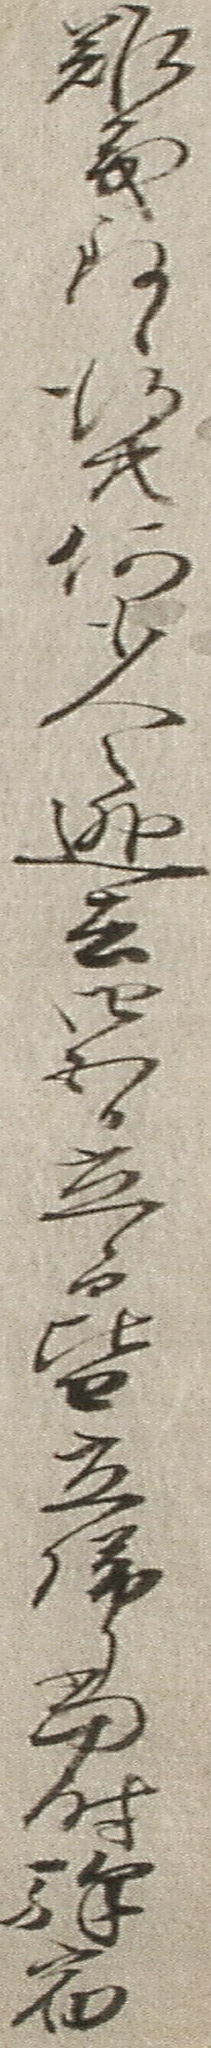難義致候得共何も人々逃去四五日立候而皆立帰り当時駅宿
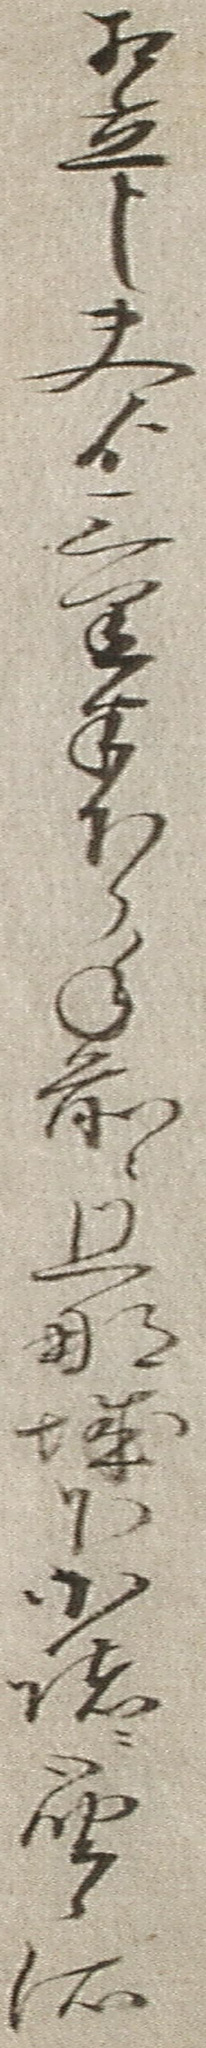相立申候夫ゟ三里半下り手前に旦那城下小諸に御座候所
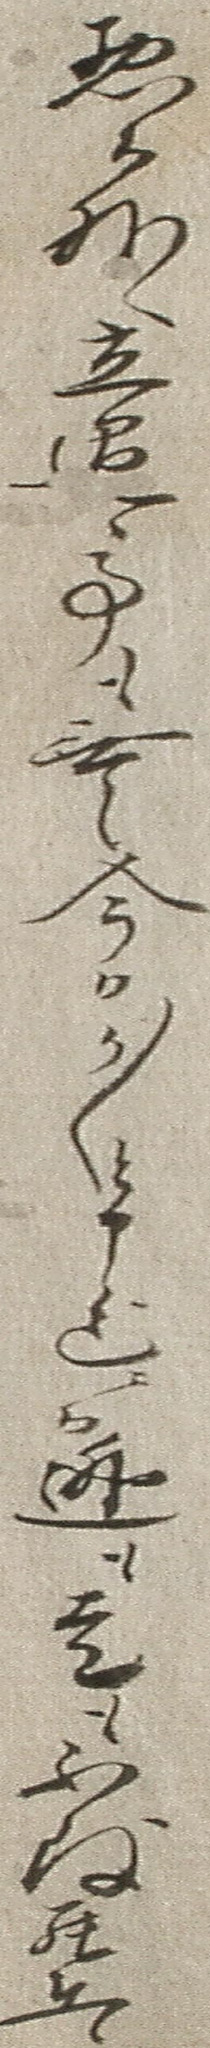惣而外へ立退候事も無之今日か〳〵と申迄ニ而逃も走も不致罷在候
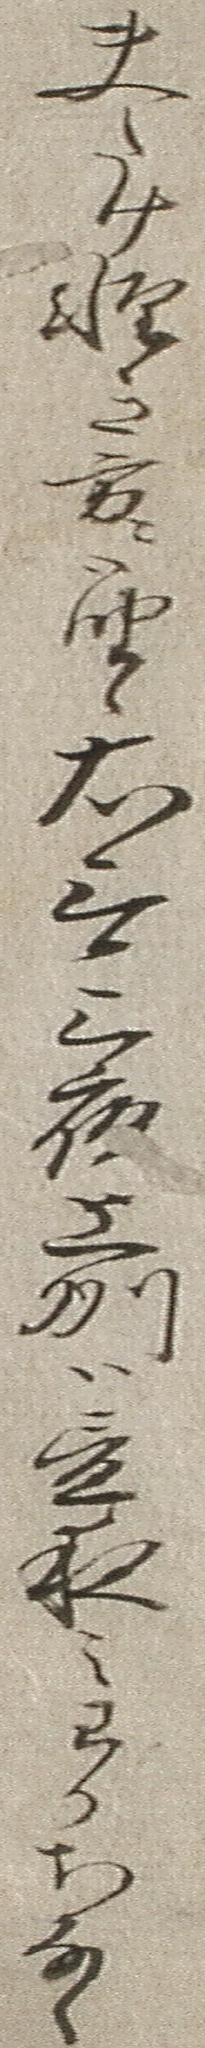夫たけ軽き方に御座候右三日三夜上州は昼夜之わかちなく
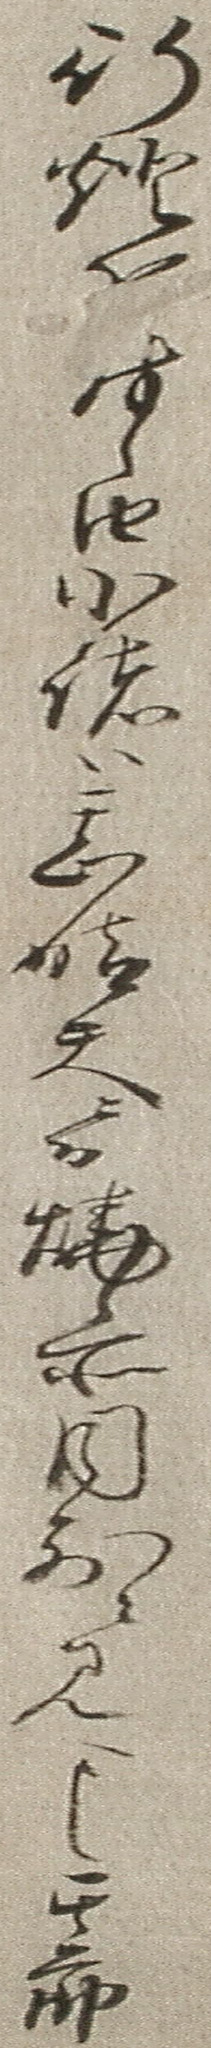行燈を付候由小諸は甚晴天に而焼所目前に見へ申候其節
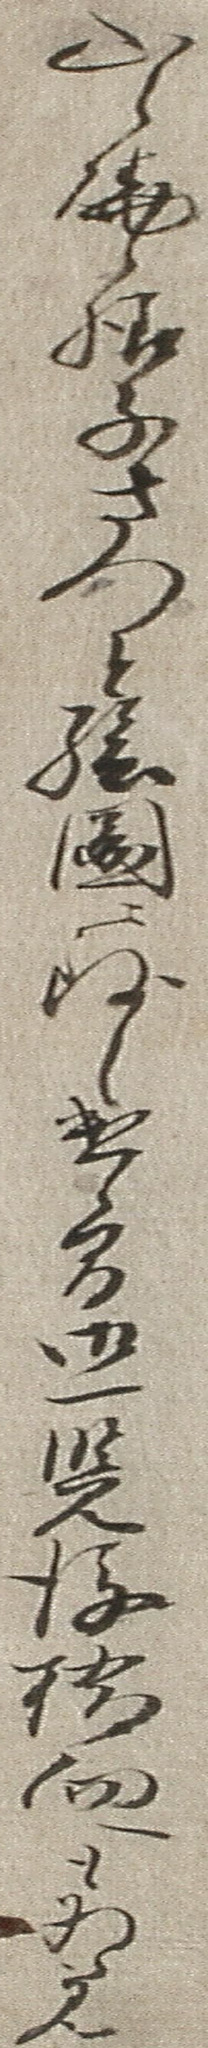山之焼候様子さつと絵図に致し遣候間御一覧後橋向へも為御見
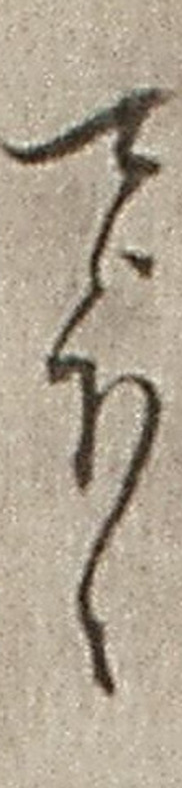可被下候
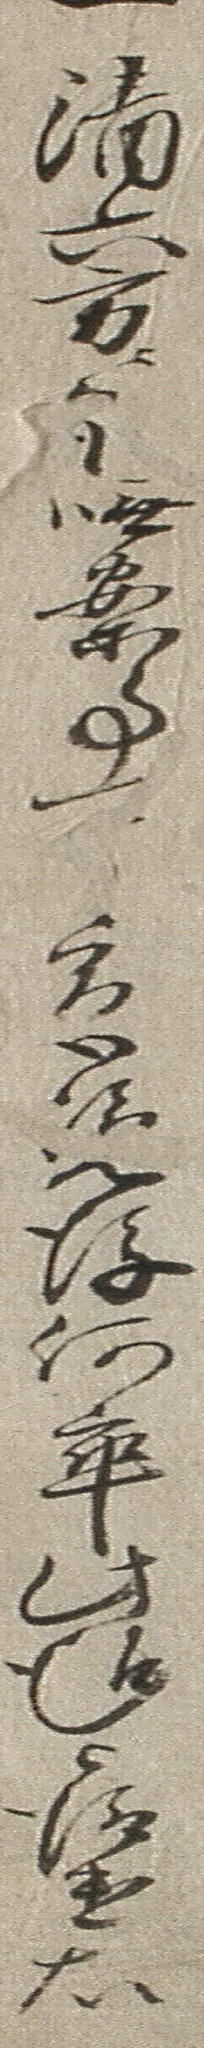一清六方に而も嘸案事可候間御覧後何卒此趣被後遣右
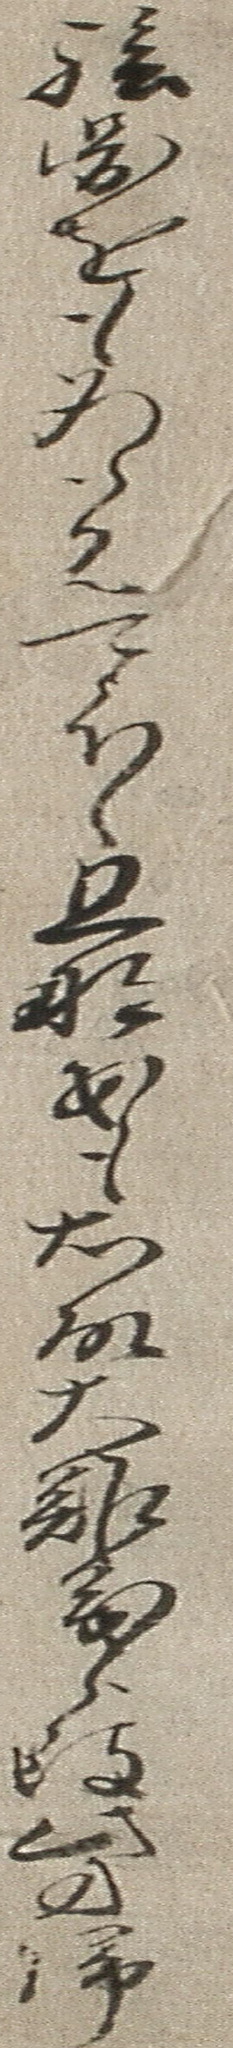絵図をも為御見可被下候旦那義も右故大難義被致此方帰
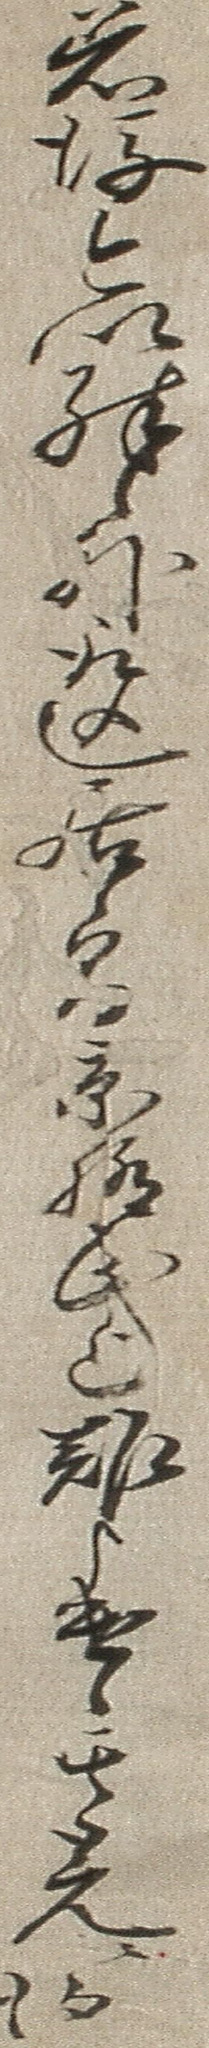着後今以殊之外取込居候間京極氏迄難申遣候其御元ニ而も
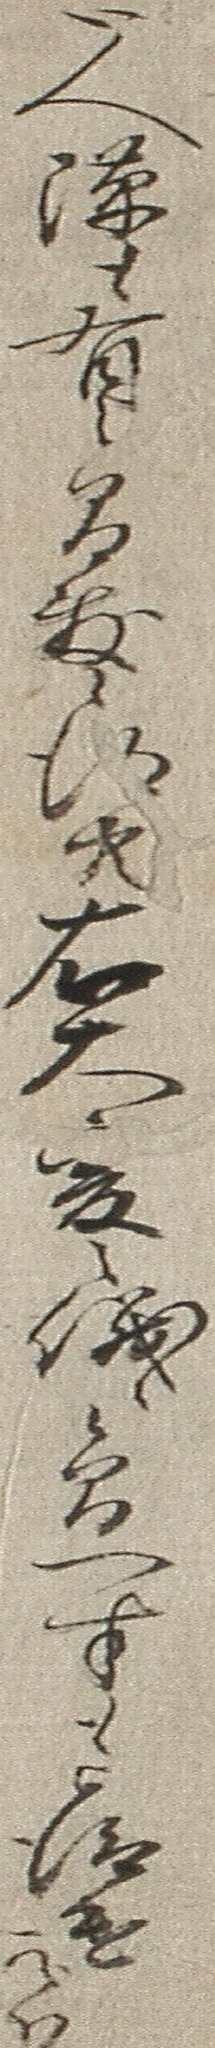御人障も有之間敷候得共右大変之儀に候間一寸も被渡遣可被下候
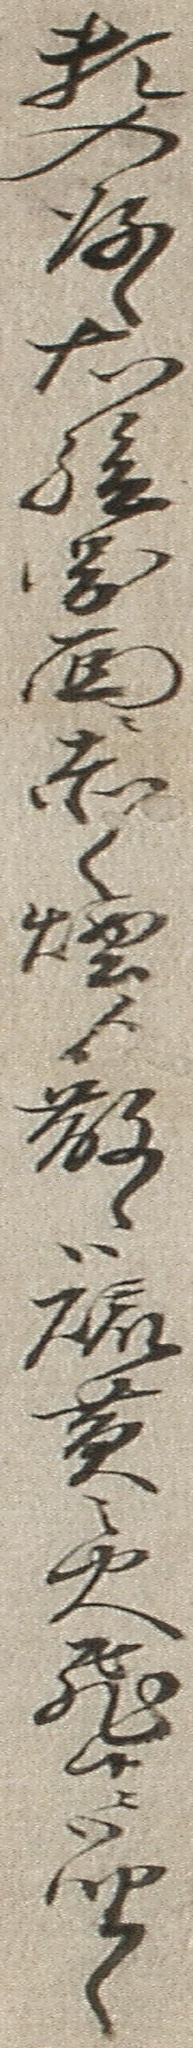頼入存候右絵図面に赤く煙ゟ散候は硫黄之火飛候に御座候
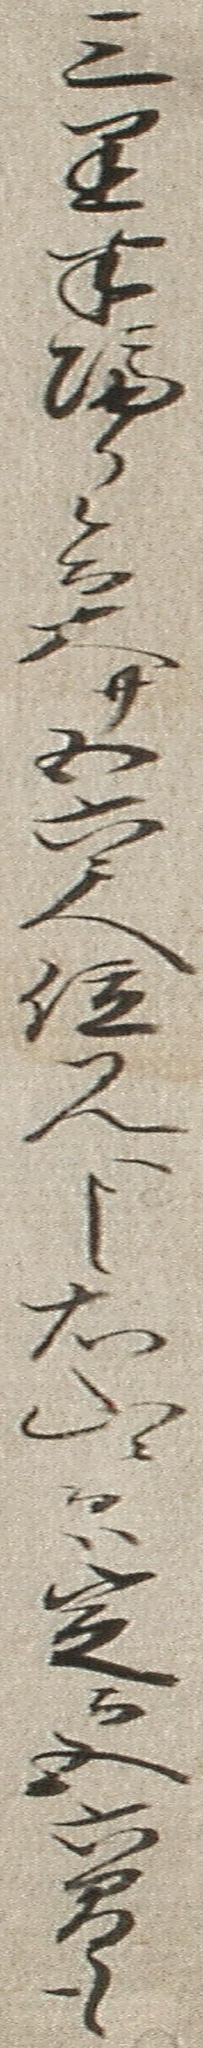三里半隔り候而大さ五六尺位見へ申候右山に而は定而五六間も
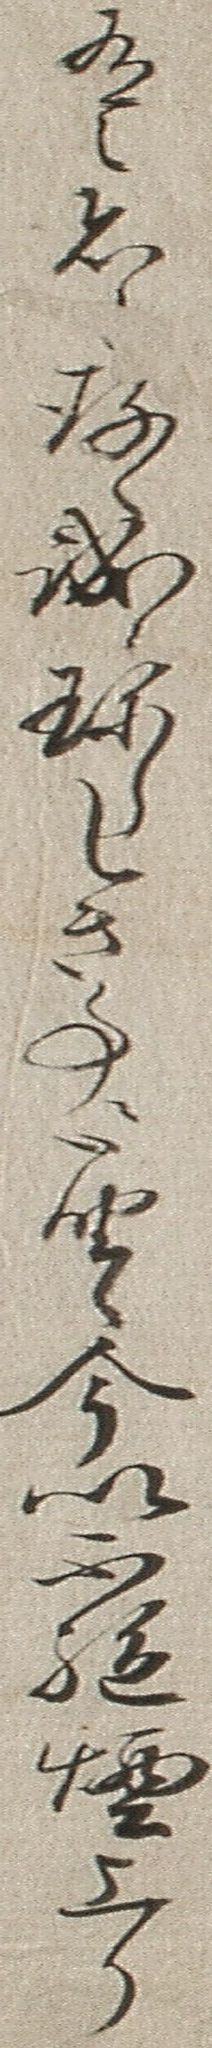有之者と存候誠に珍らしき事に御座候今以不絶煙上り
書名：太平秘録抜書　浅間山燒及普賢山崩
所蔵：東京大学地震研究所図書室 Earthquake Research Institute Library, The University of Tokyo, JAPAN
